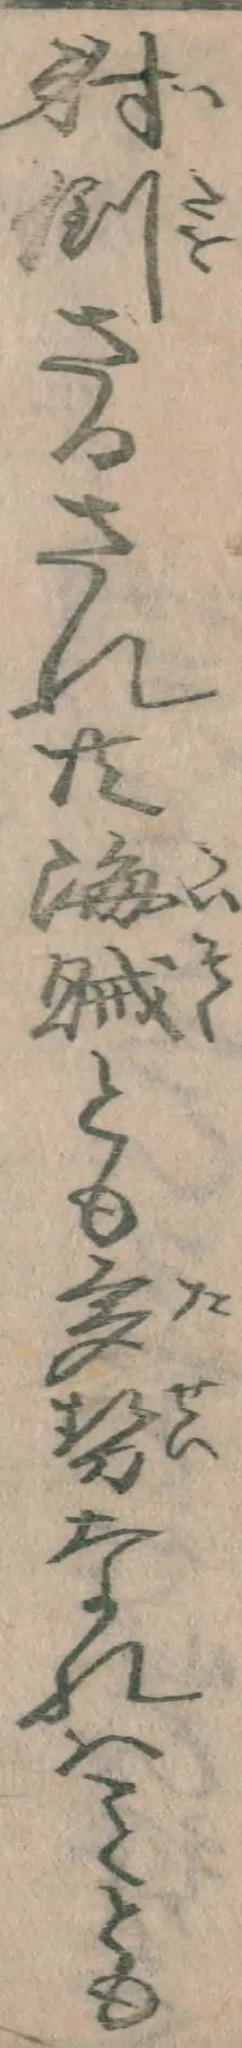射倒さるされ共海賊とも多勢なれはこととも
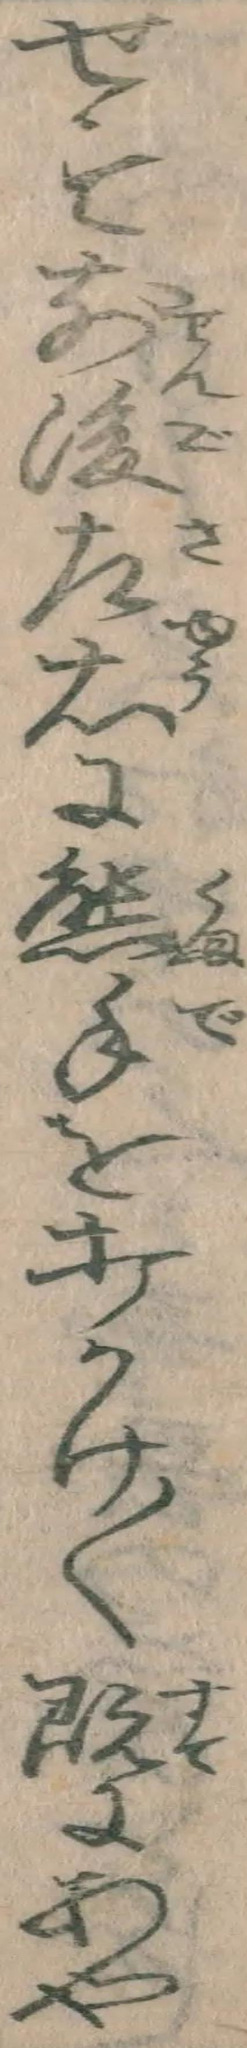せす前後左右に熊手を打かけ〳〵既にあや
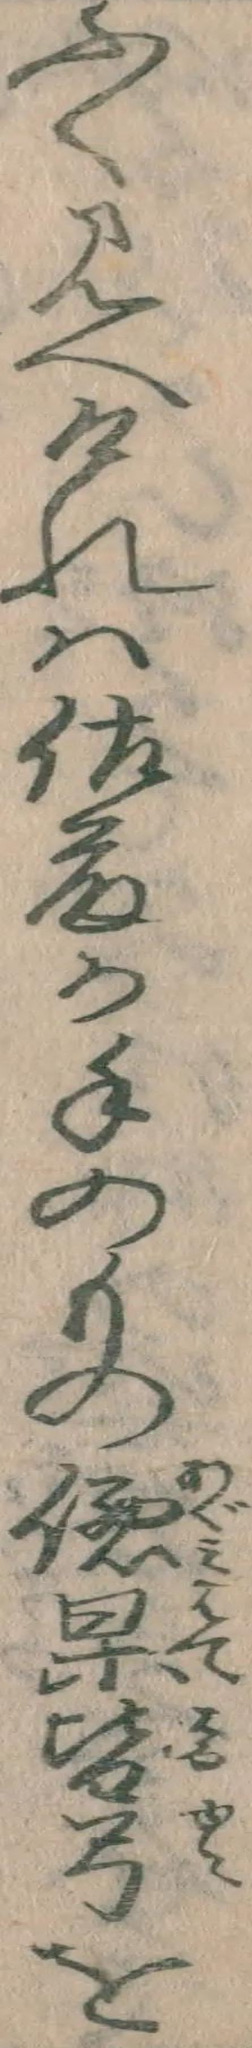ふく見へけれは佐藤か手のもの僫果皆弓を
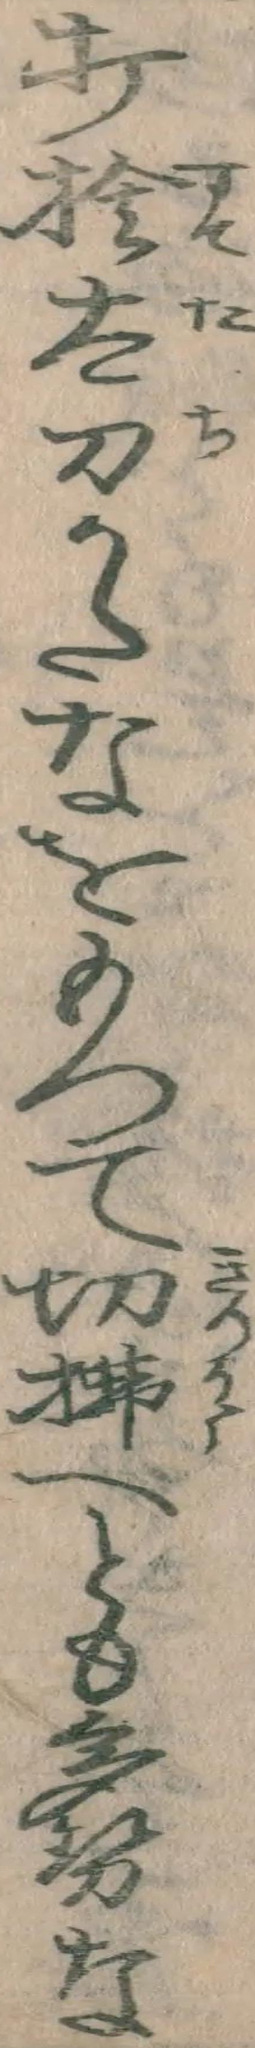打捨太刀かたなをもつて切払へとも多勢な
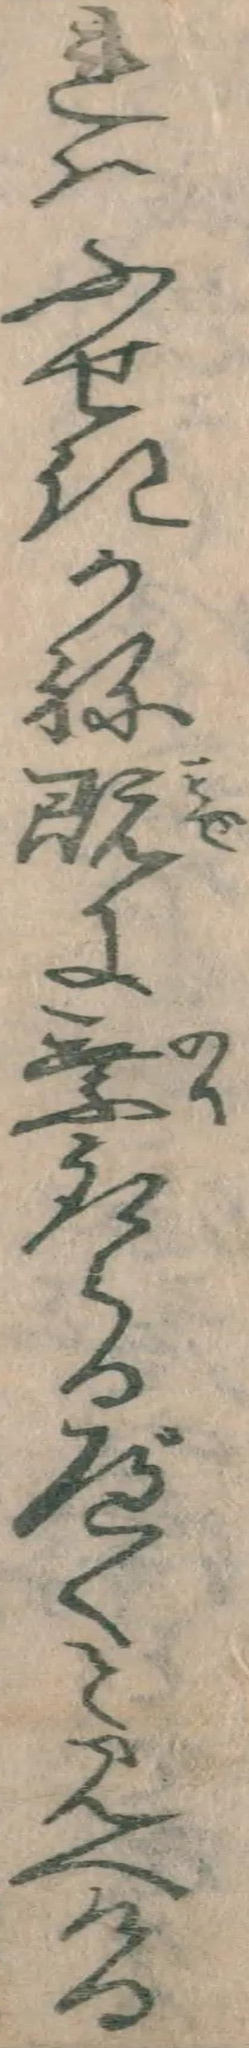れはふせきかね既に乗取らるべくと見へける
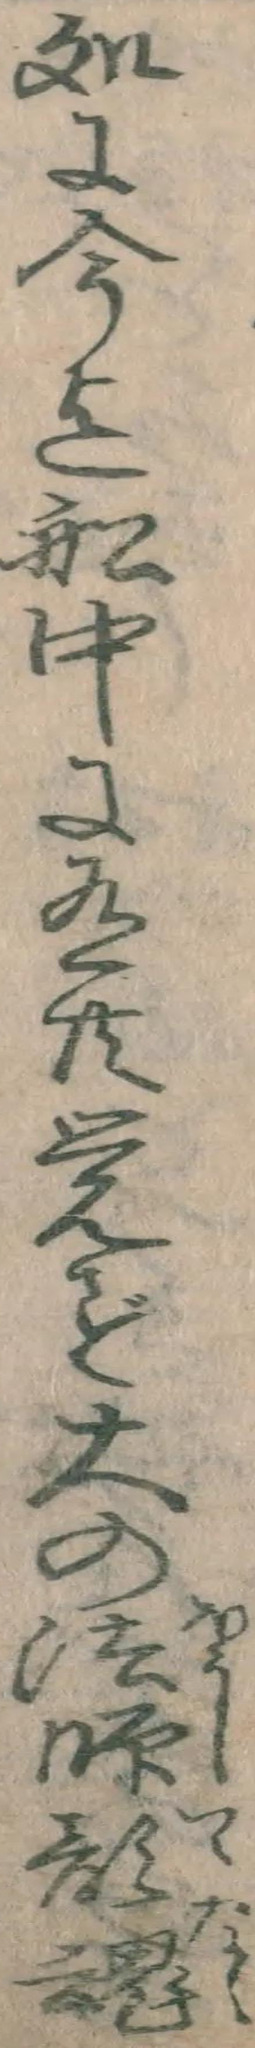処に今迄船中に有共覚ず大の法師顔魂
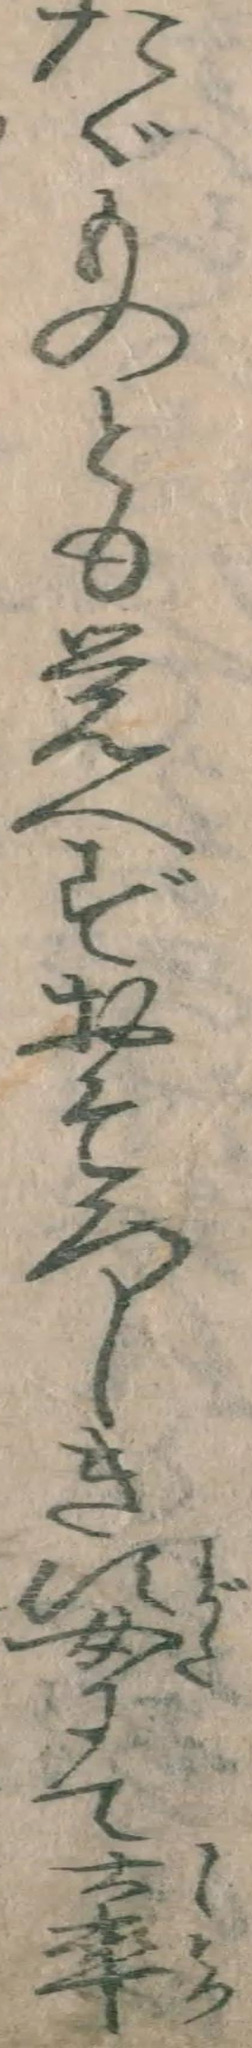たゞものとも覚へずおそろしき姿にて士卒
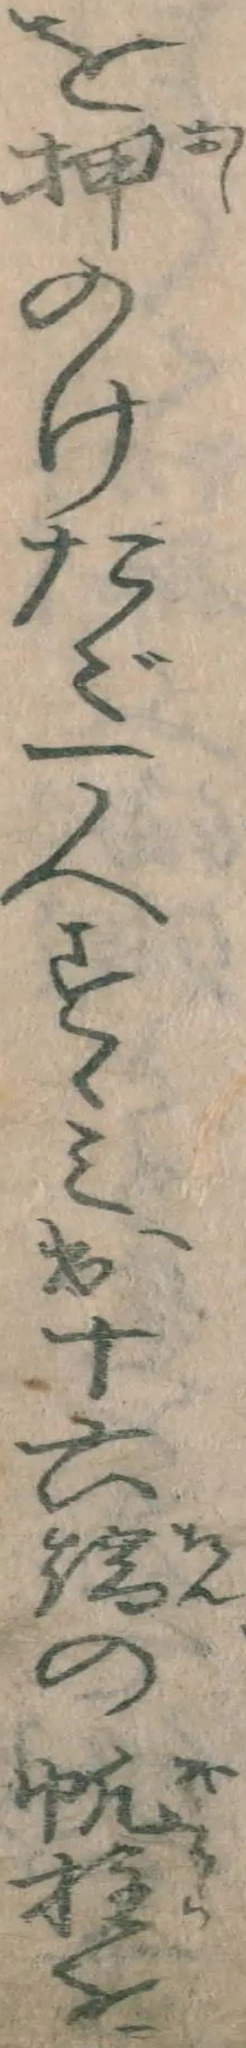を押のけたゞ一人すゝみ出十六端の帆柱を
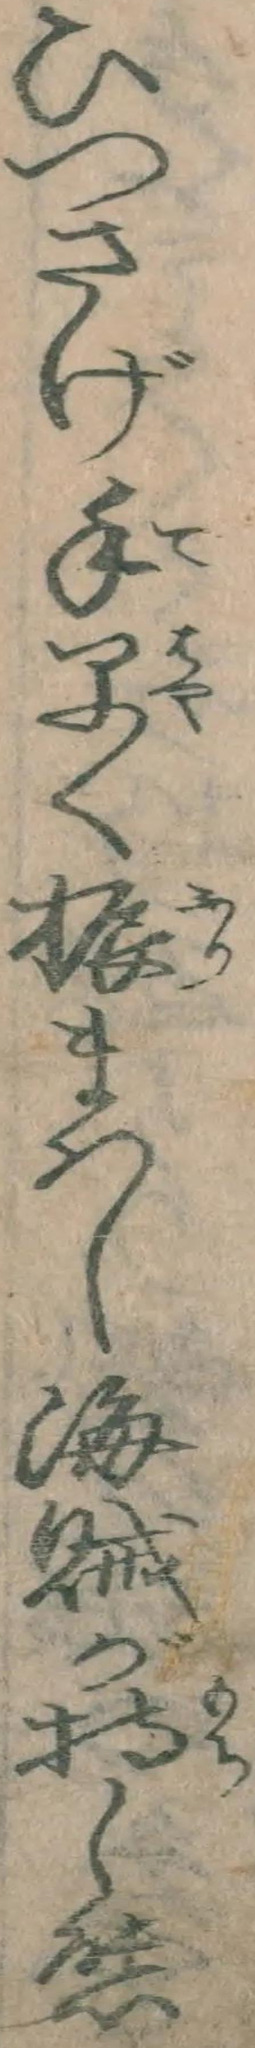ひつさげ手早く振まはし海賊が持し熊

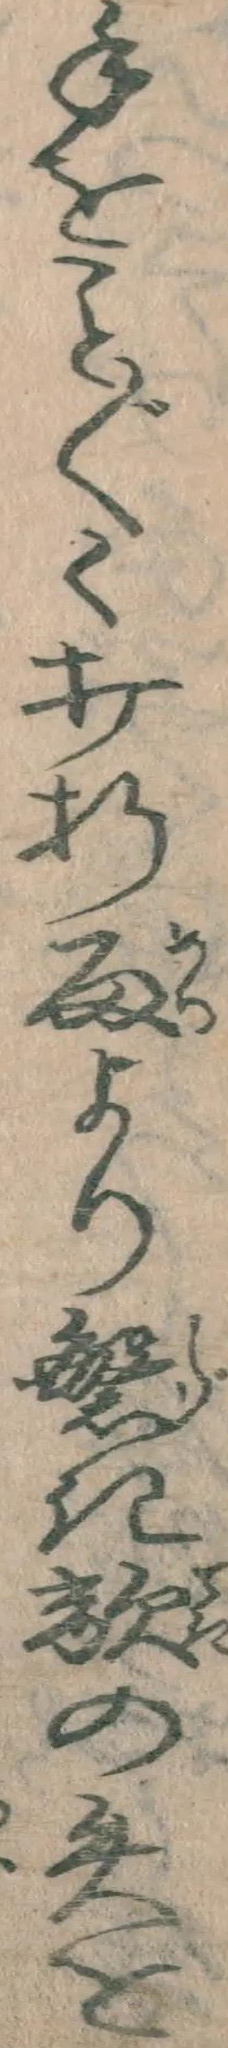手をこと〴〵く打折雨より繁き敵の矢を
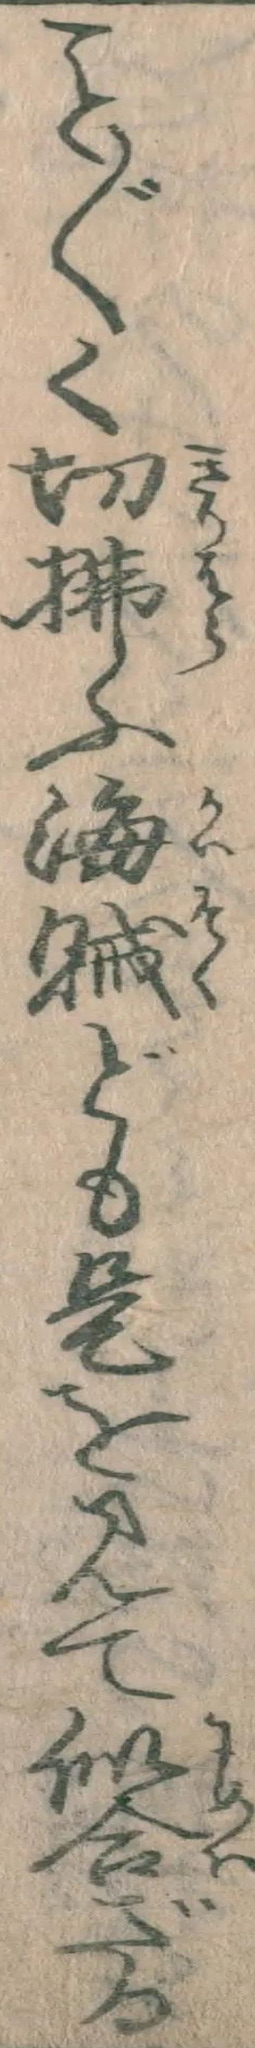こと〴〵く切払ふ海賊ども是を見て似合ざる
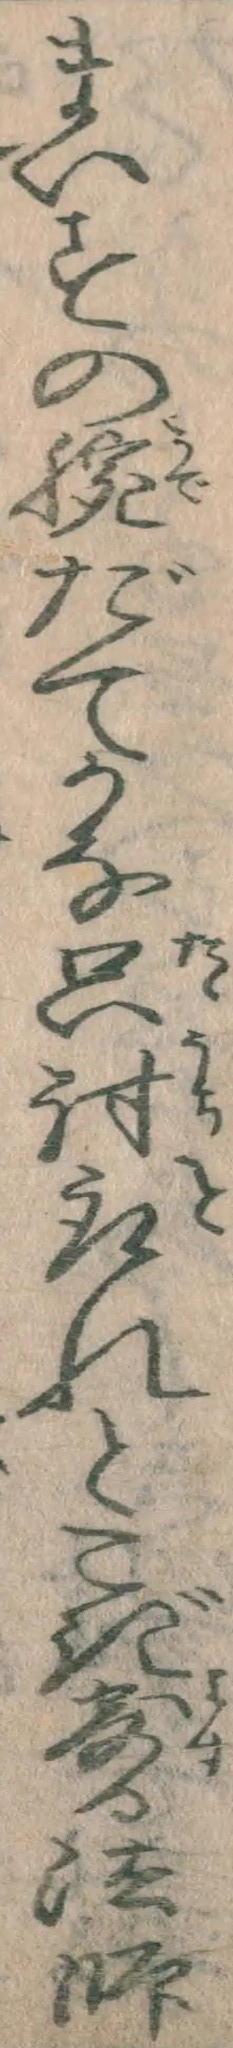まいすの腕だてかな只討取れとこぎ寄る法師
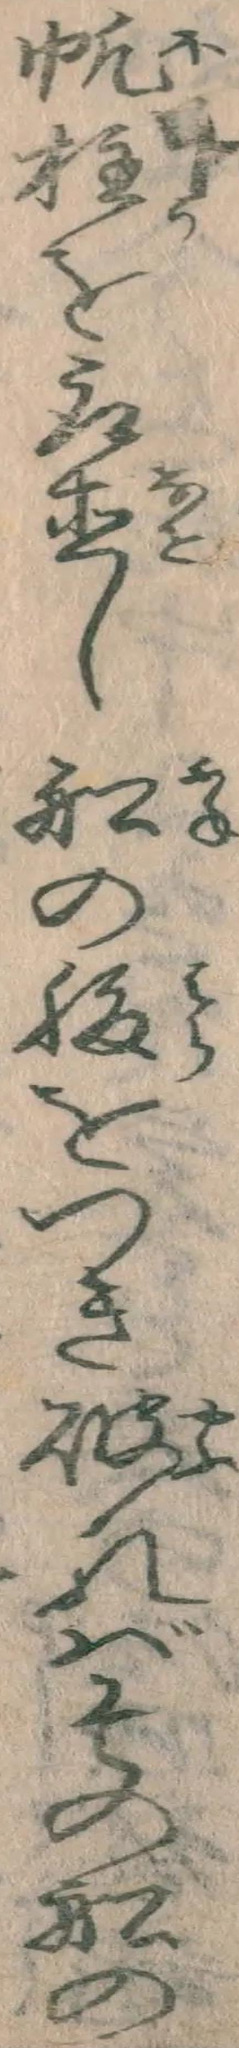帆柱を取直し船の腹をつき破ればその船の
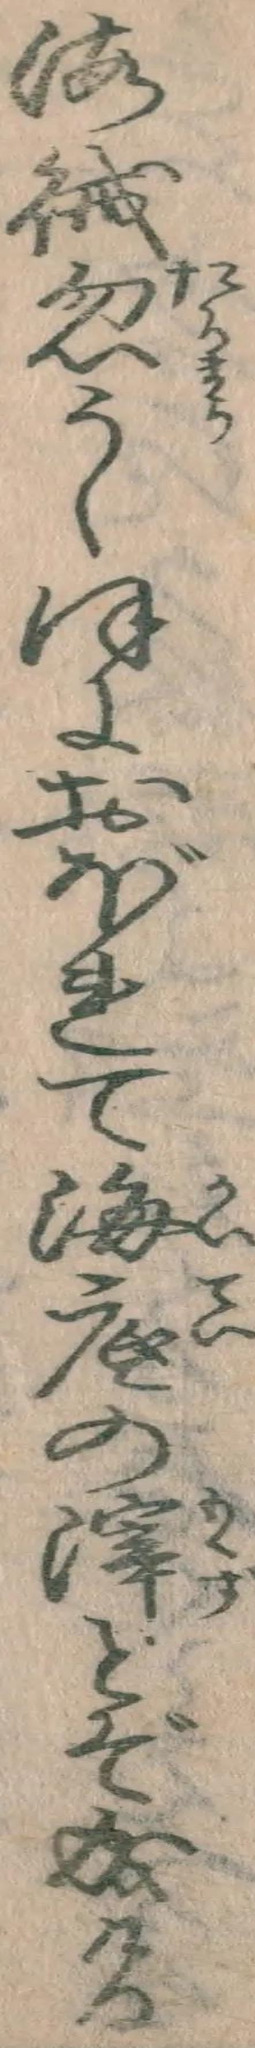海賊忽うしほにおぼれて海底の滓とぞ成ける
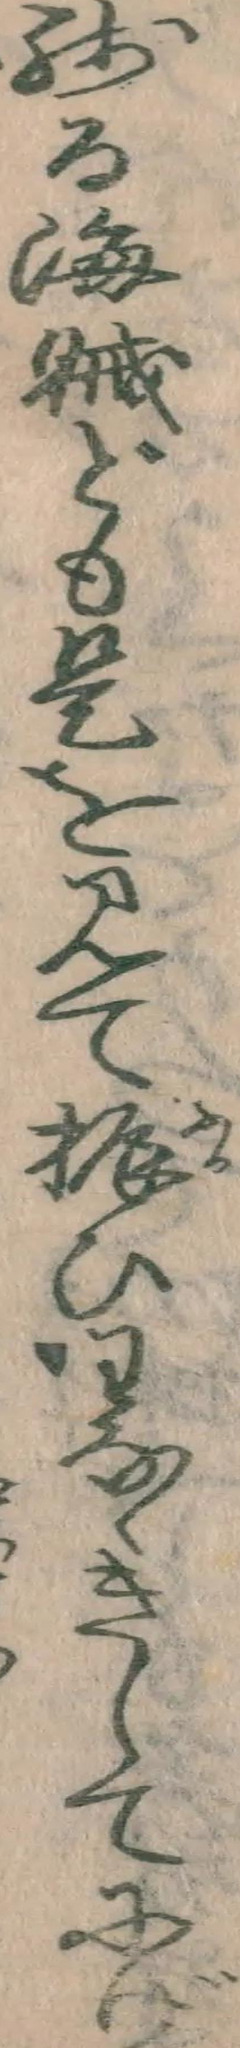残る海賊ども是を見て振ひわなゝきしてにげ
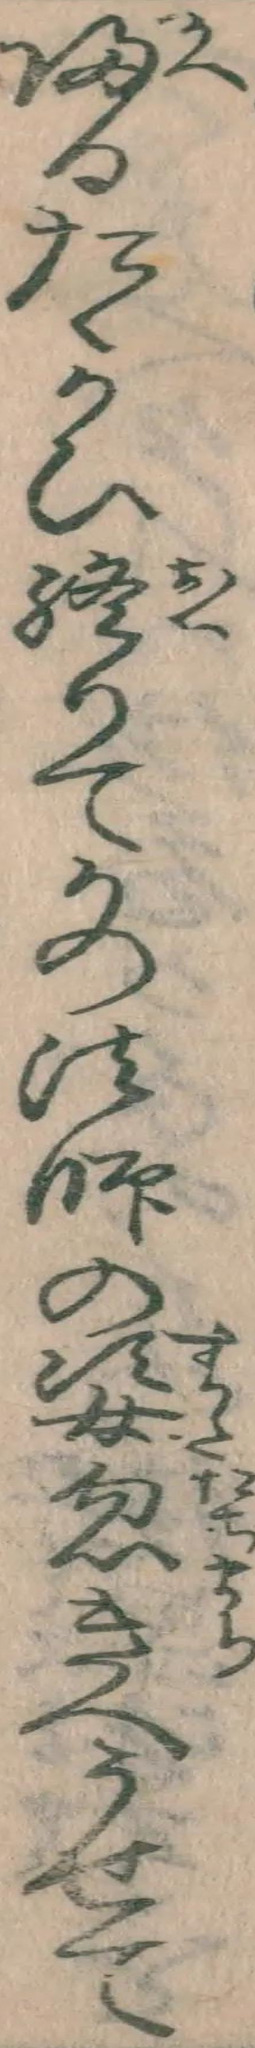帰るたゝかひ終りてかの法師の姿忽きへうせて
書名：怪談御伽童 5巻. [1]
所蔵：国立国会図書館 National Diet Library, JAPAN
